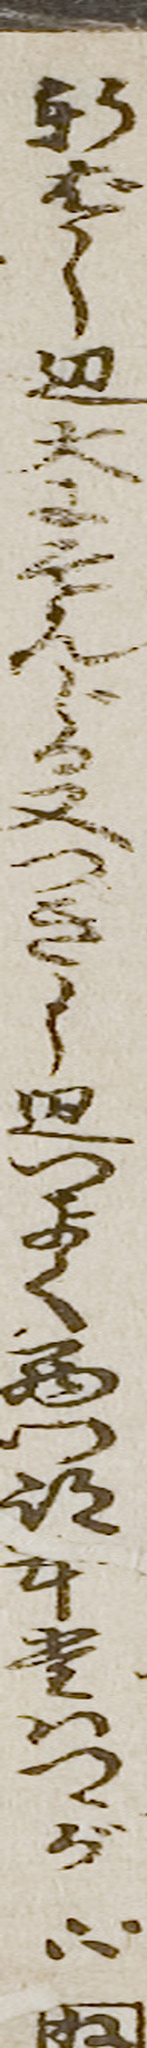新ばし辺大にそんじる又つきし辺つよく西門跡本堂はつゝが
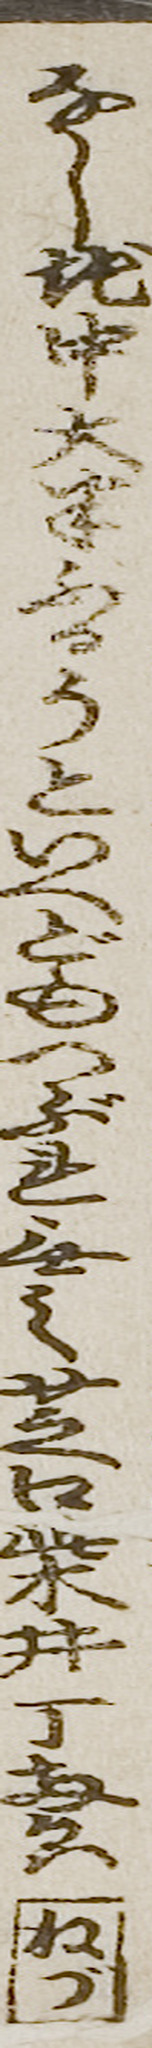なし地中大半ふるうといへどもつぶれ無之芝口柴井丁両かは
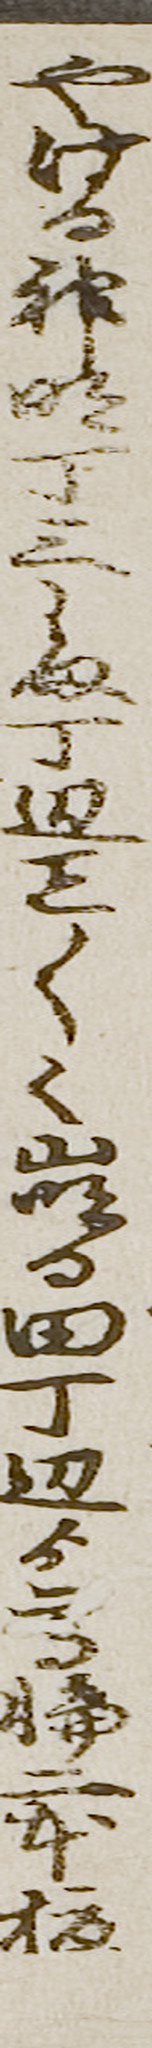やける神明丁三しま丁辺こと〳〵く崩る田丁辺ゟ高輪二本榎
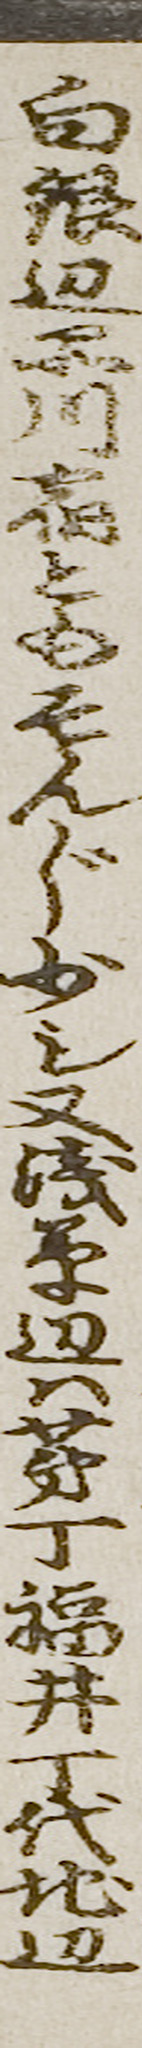白銀辺品川宿ともそんじ少シ又浅草辺は茅丁福井丁代地辺
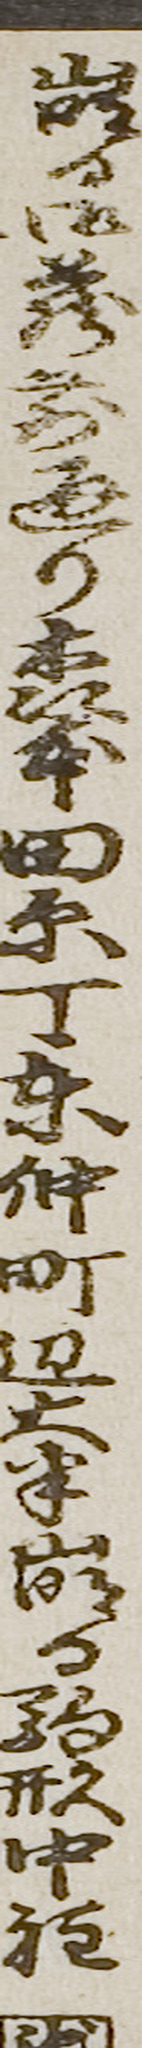崩る御蔵前通り森本田原丁東仲町辺大半崩る駒形中程
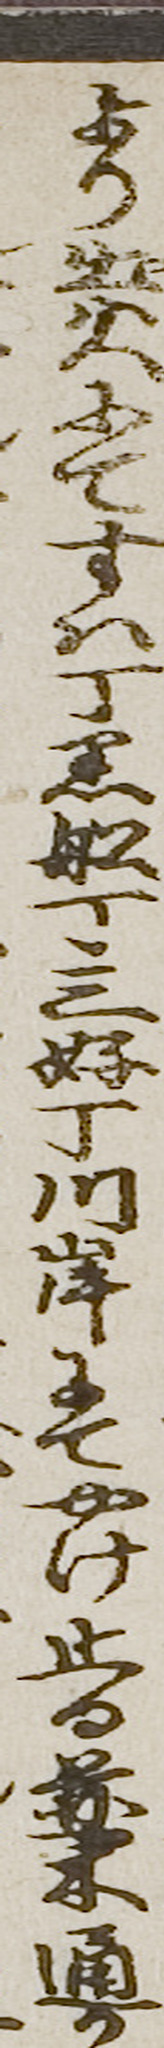より出火にてすは丁黒船丁三好丁川岸にてやけ止る並木通り
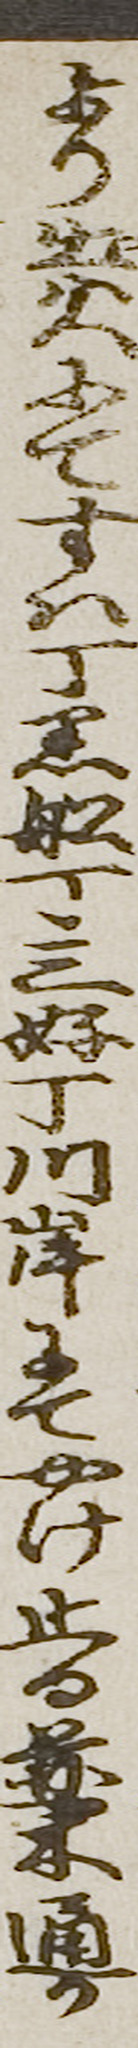より出火にてすは丁黒船丁三好丁川岸にてやけ止る並木通り
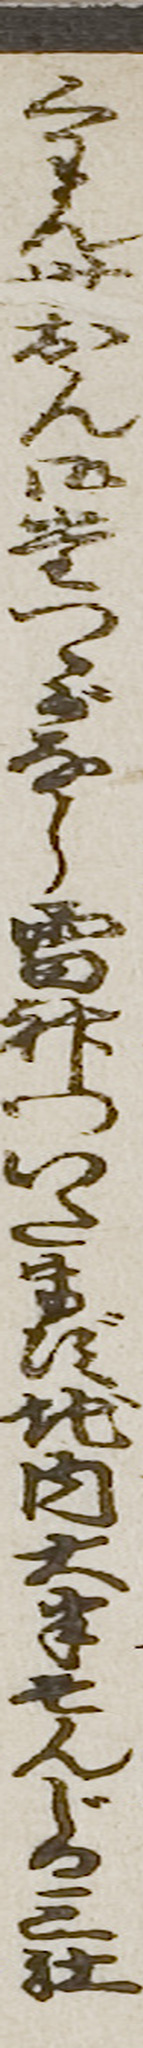くわん世おん御堂つゝがなし雷神門いたまず地内大半そんじる三社
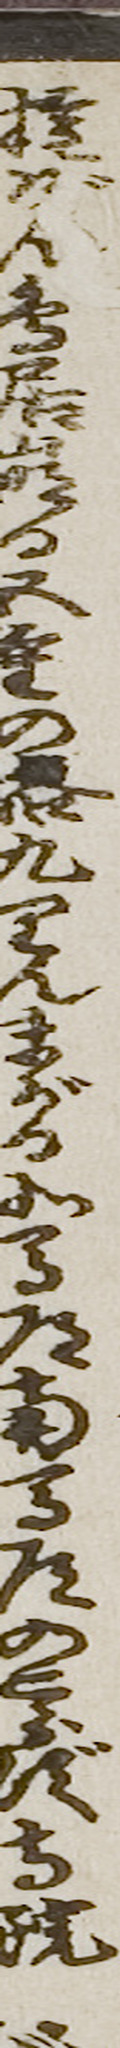権げん鳥居崩る五重の塔九りんまがる北馬道南馬道のこらず寺院
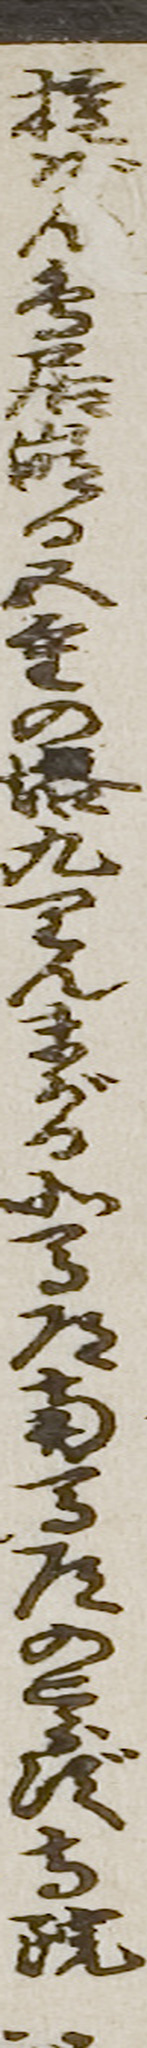権げん鳥居崩る五重の塔九りんまがる北馬道南馬道のこらず寺院
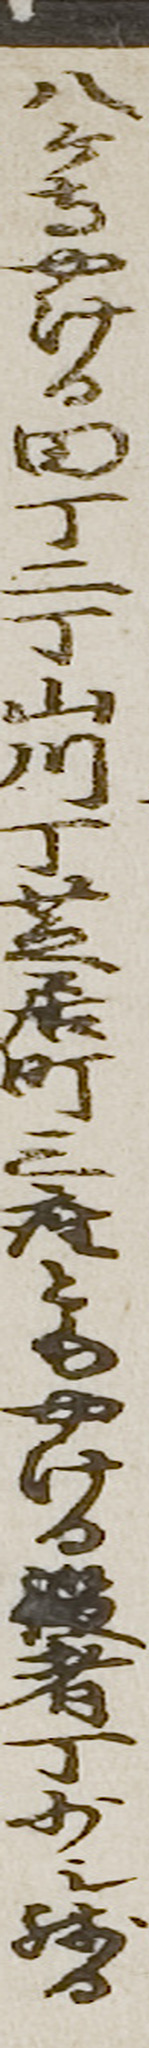八ケ寺やける田丁二丁山川丁芝居町三座ともやける役者丁少シ残る
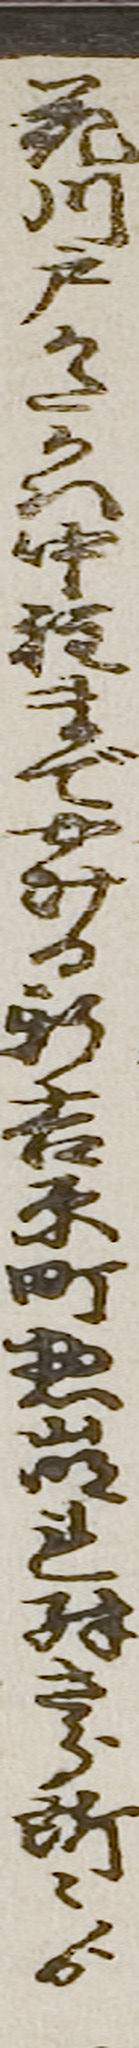花川戸かたかは中程までやける新吉原町惣崩れ殊さら所々ゟ
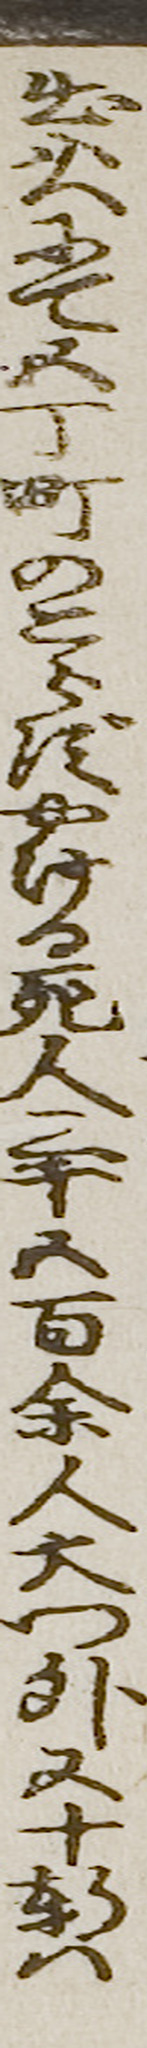出火にて五丁町のこらずやける死人三千五百余人大門外五十軒は
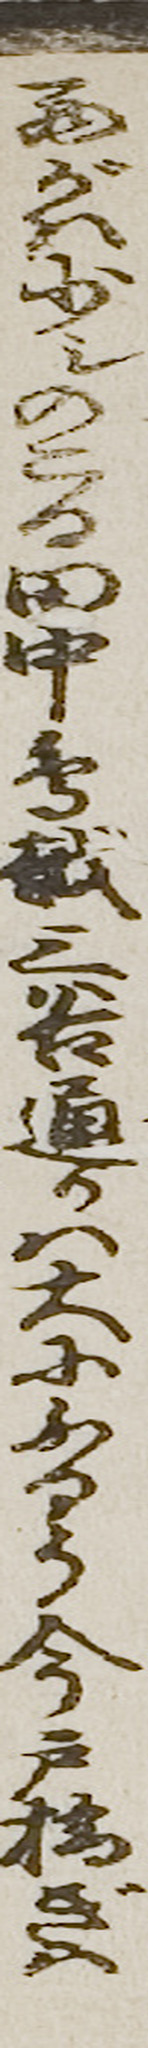西がは少シのこる田中鳥越三谷通りは大にふるう今戸橋ぎは
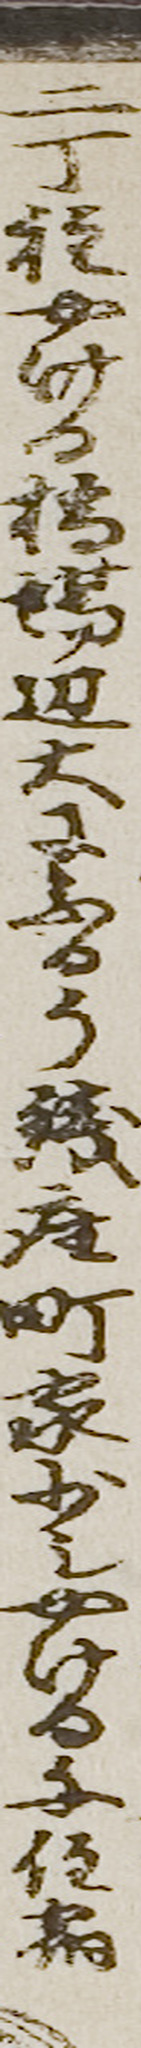二丁程やける橋場辺大にふるう銭座町家少シやける千住宿
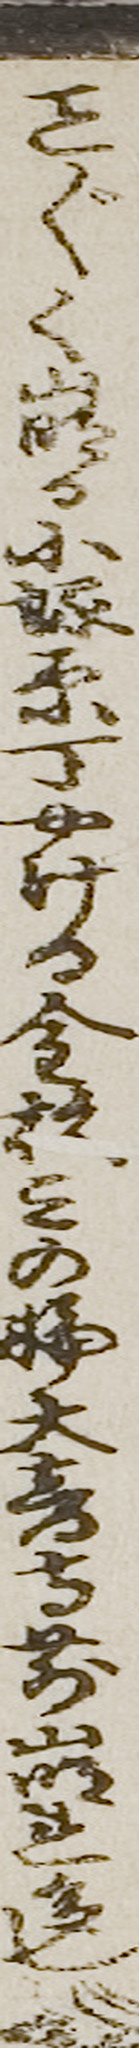こと〴〵く崩る小塚原丁やける金杉三の輪大音寺前崩れ多し
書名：安政改正泰平盤石図会
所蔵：東京大学総合図書館 General Library in the University of Tokyo, JAPAN
